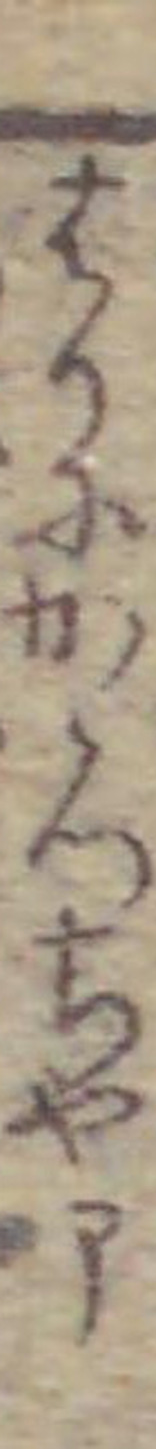はりにかゝつちやァ
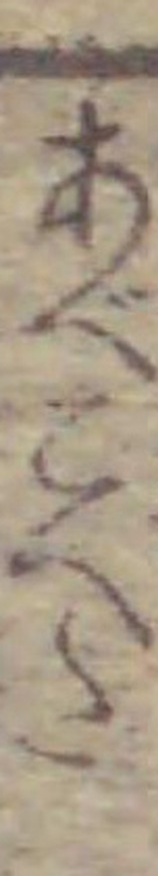あべこへた

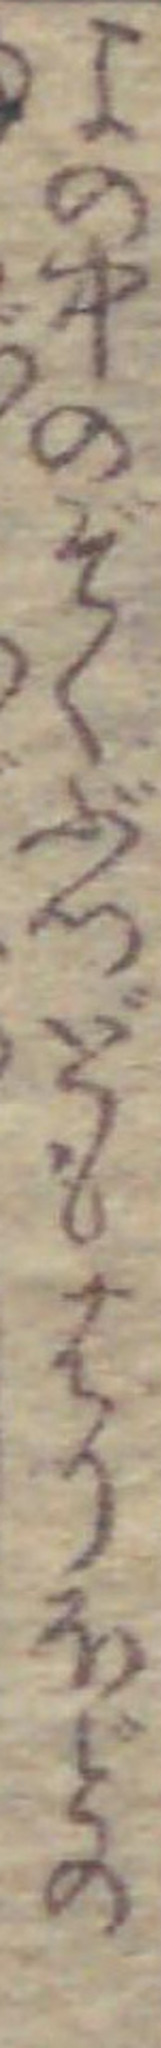よの中のぞくぶつどもはりほどの
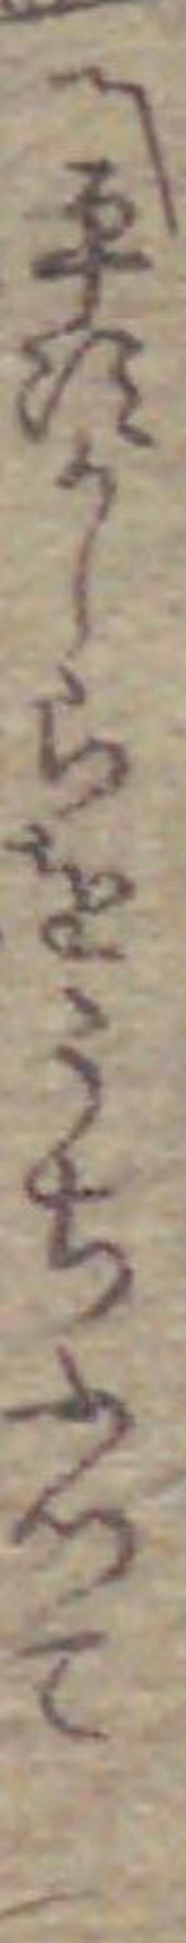〽平次かしらをうちふつて
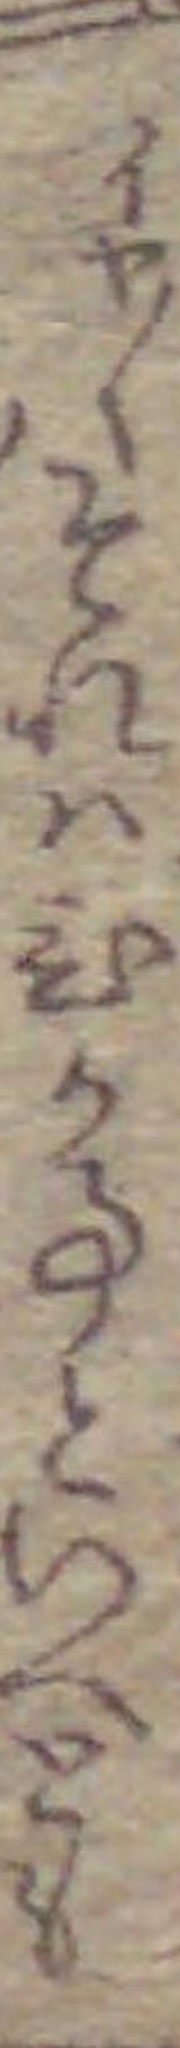イヤ〳〵それはひか事といへとも
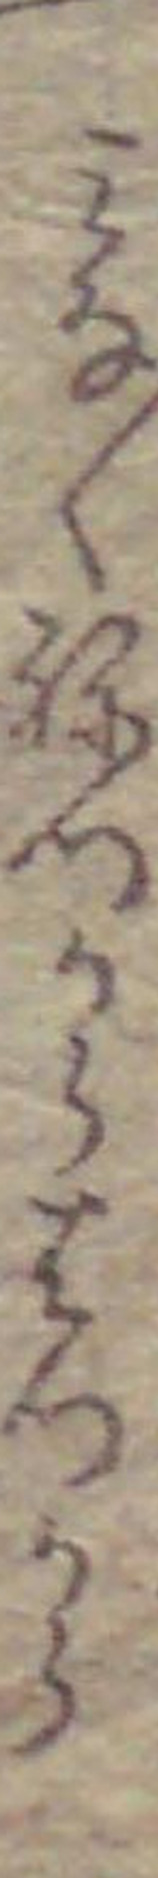みな〳〵ねつからはつから
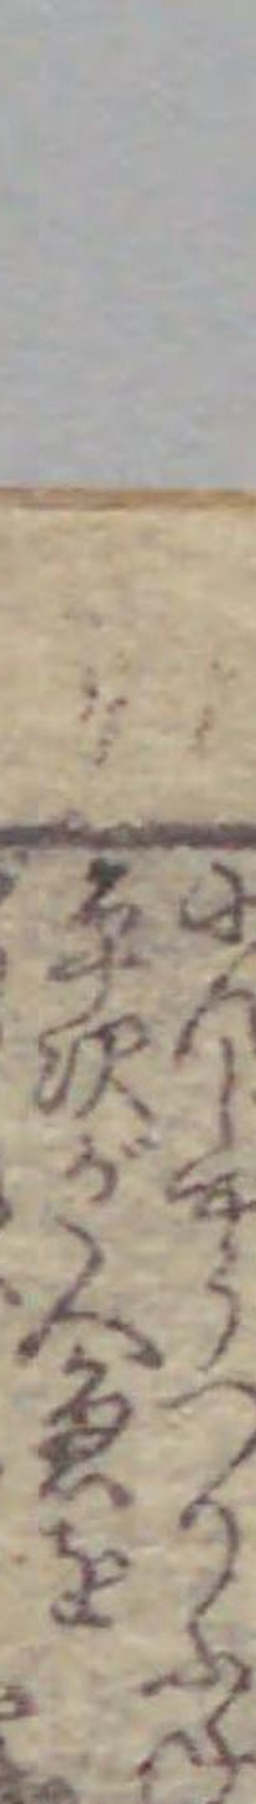平次が人魚を
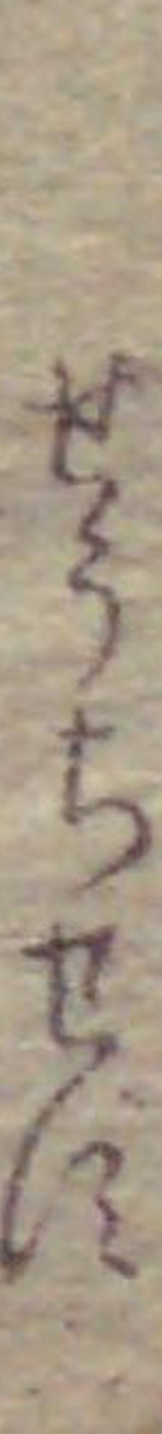せうちせず
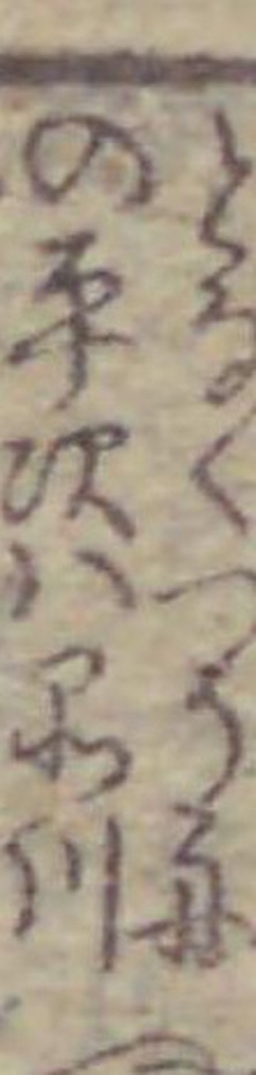の平次は品川
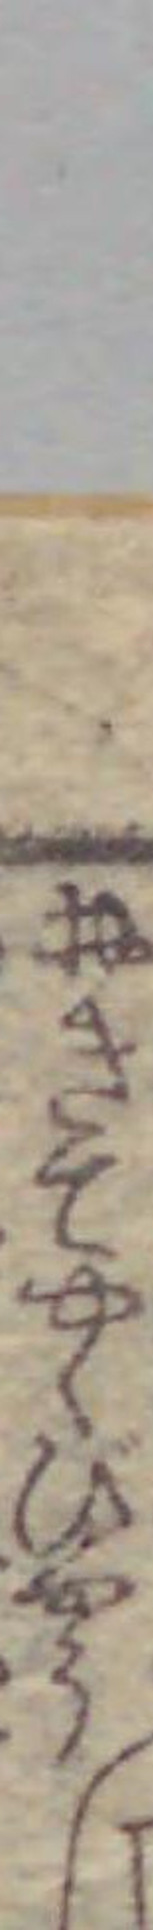おきてやくびやう
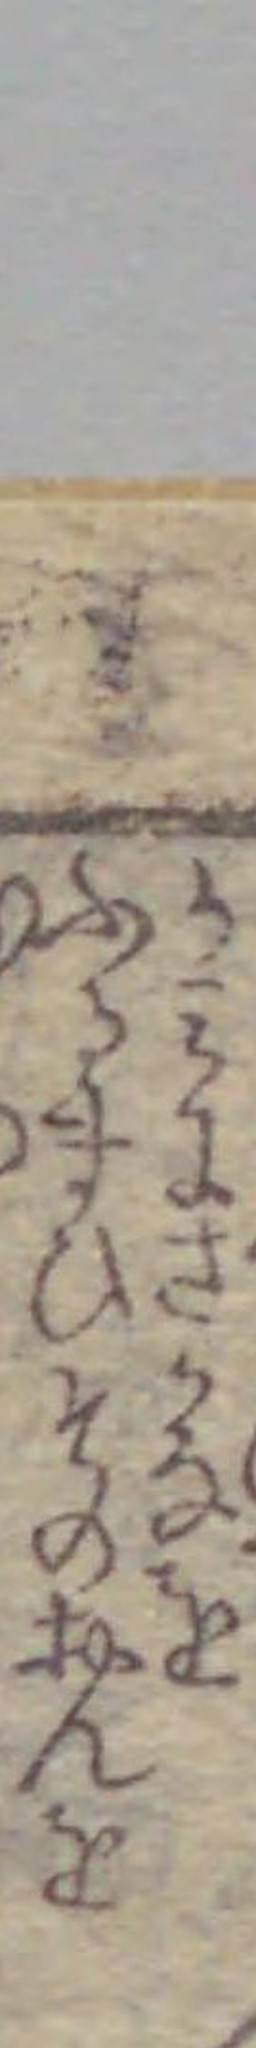ふるまひそのおんを
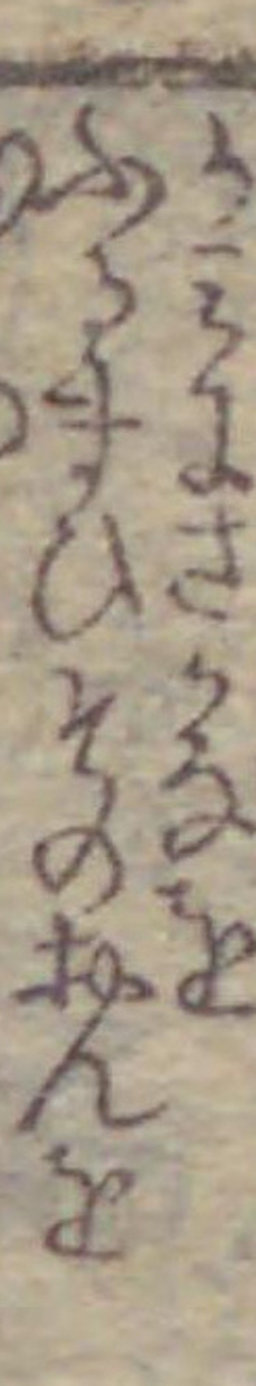ふるまひそのおんを
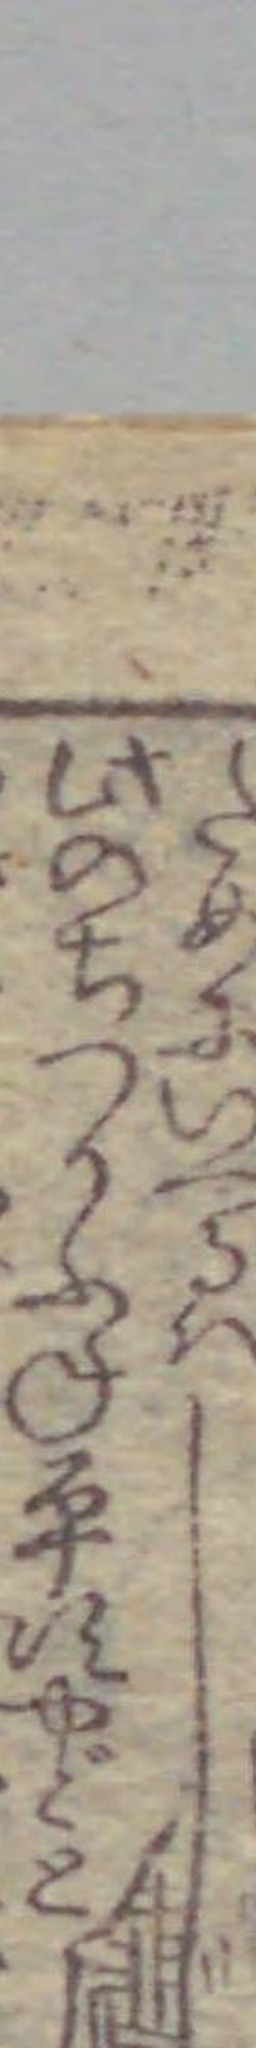此のちつりふね平次やどと
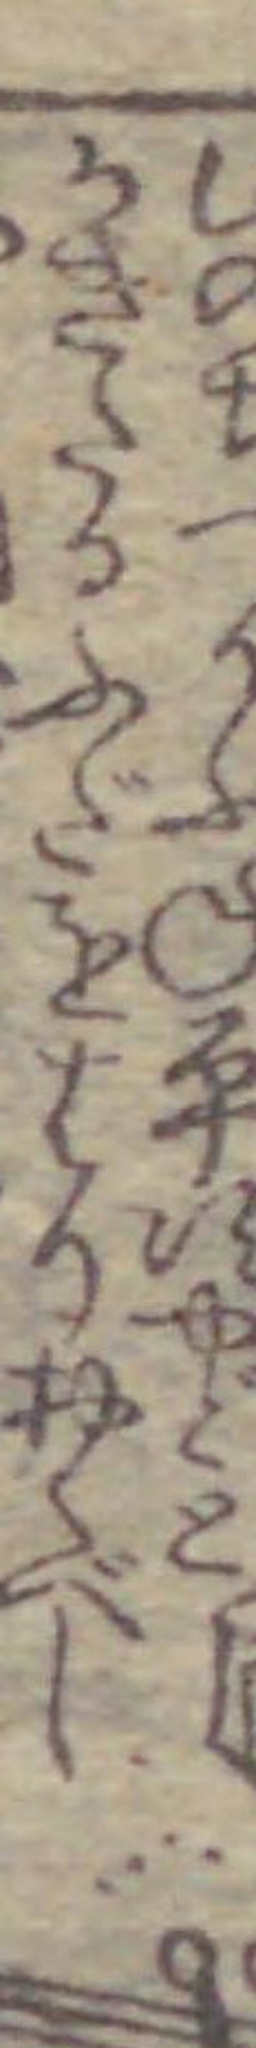かきたるふだをはりおくべし
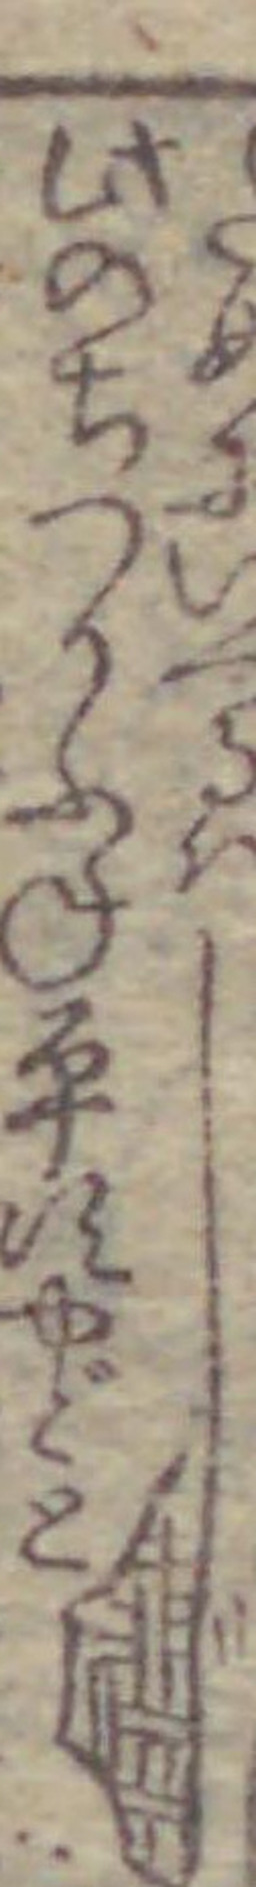此のちつりふね平次やどと
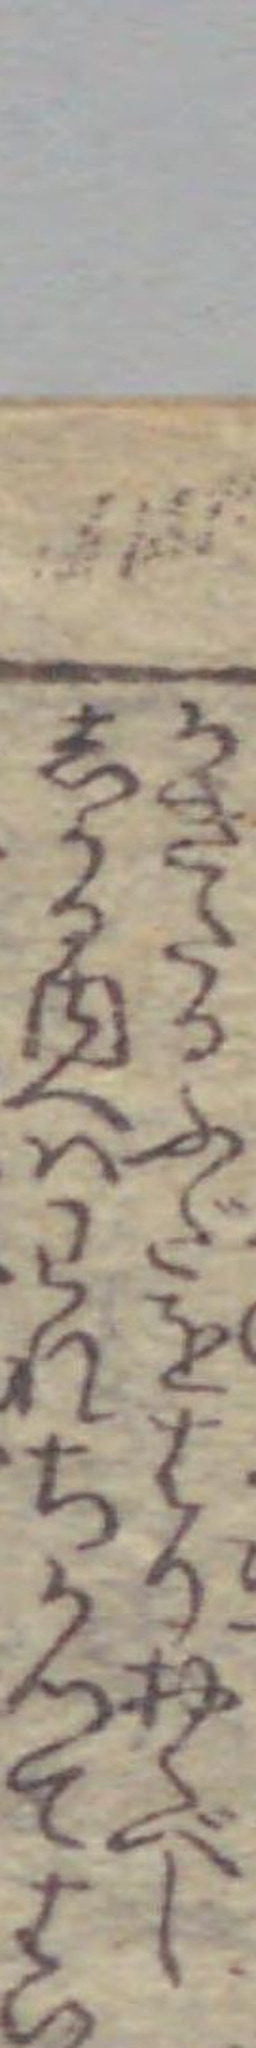しかる内へはわれちかつてはいる
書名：箱入娘面屋人魚 3巻
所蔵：国立国会図書館 National Diet Library, JAPAN
